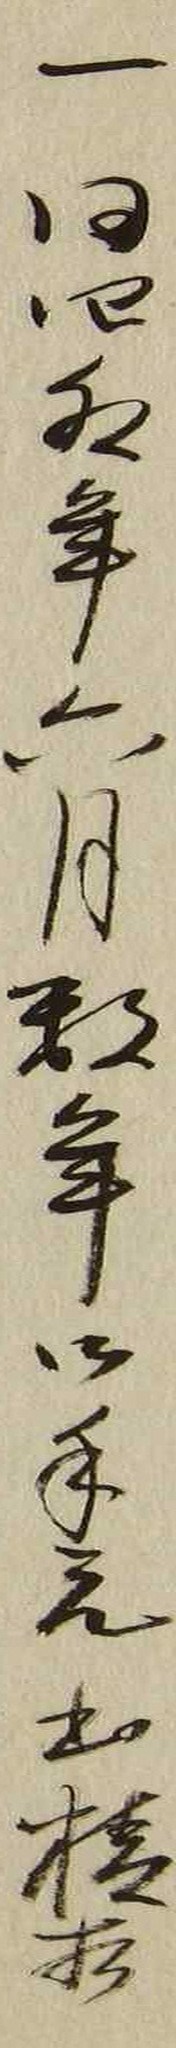一同四卯年六月数年御手元出精相
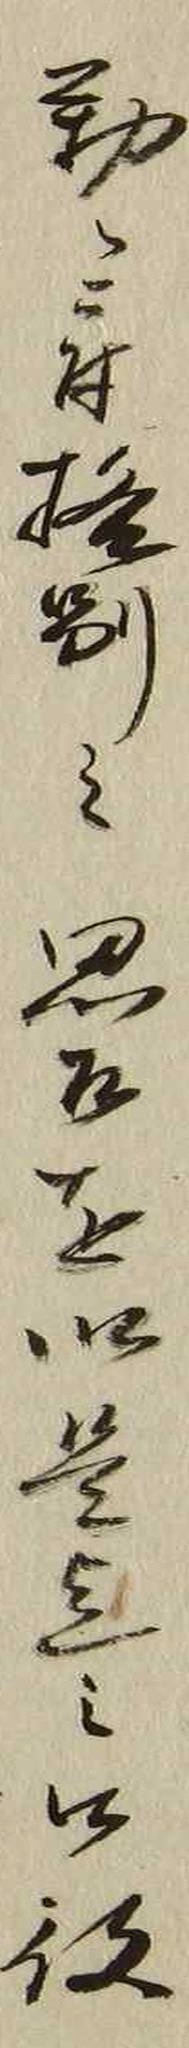勤候ニ付格別之思召を以是迄之御役
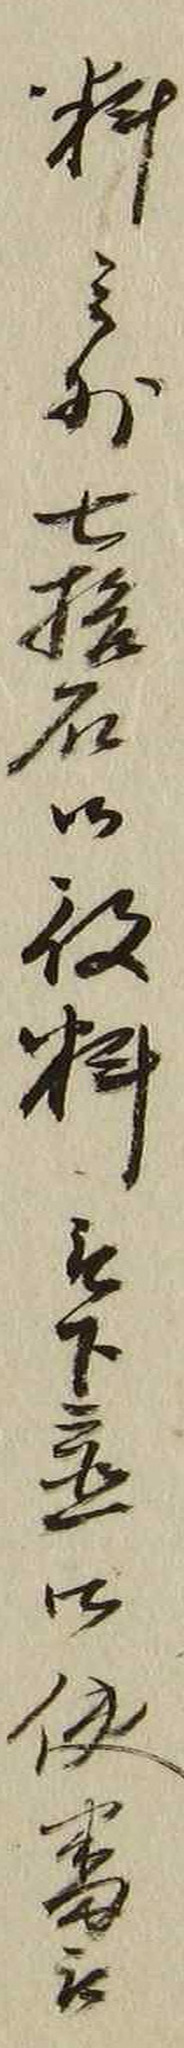料之外七拾石御役料被下置御使番被
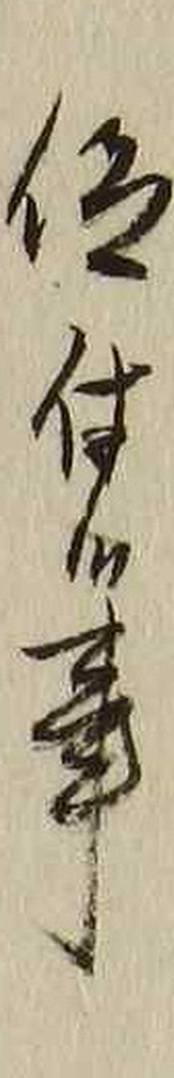仰付候事
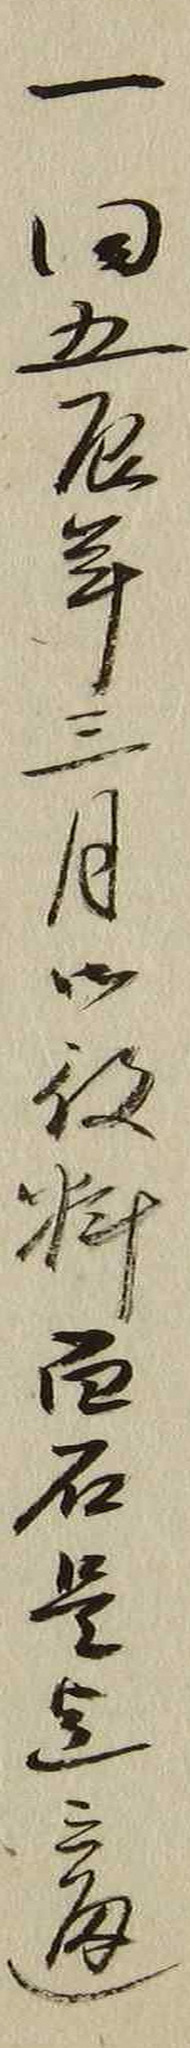一同五辰年三月御役料百石是迄之通
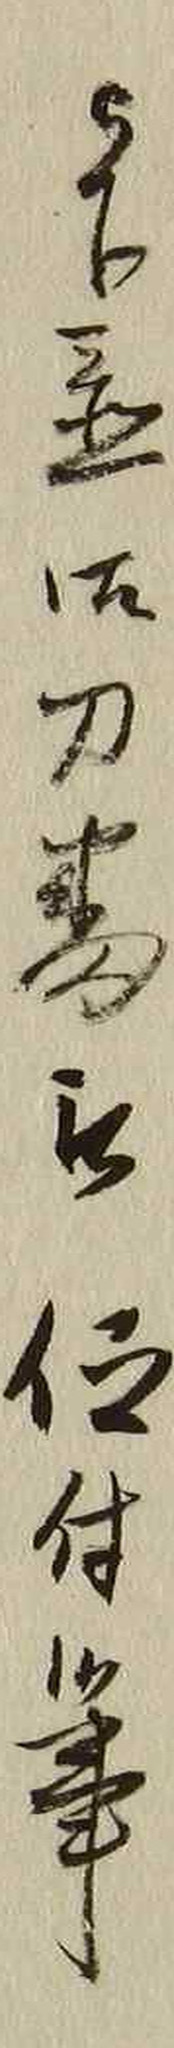被下置御刀番被仰付候事
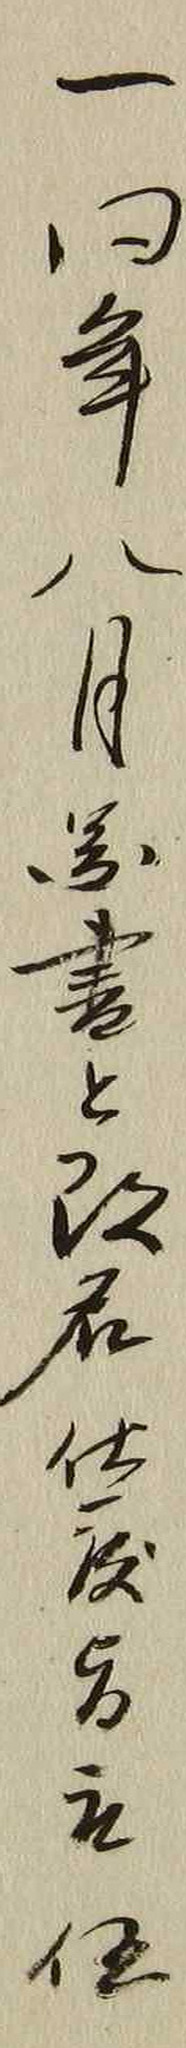一同年八月図書と改名仕度旨被任
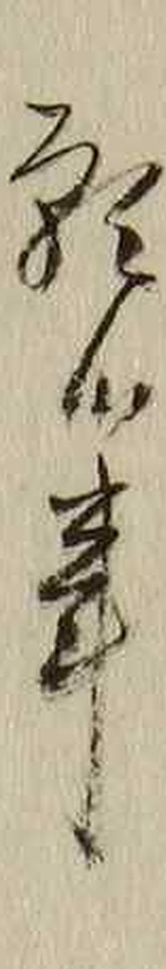願候事
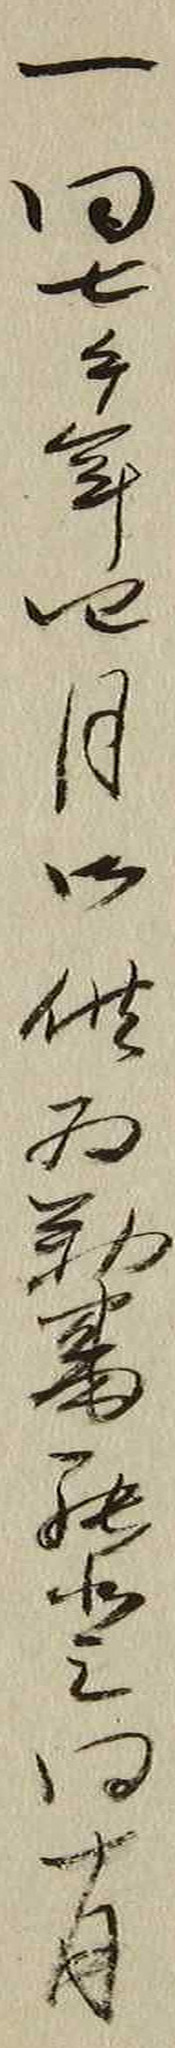一同七午年四月御供為勤番罷登同十月
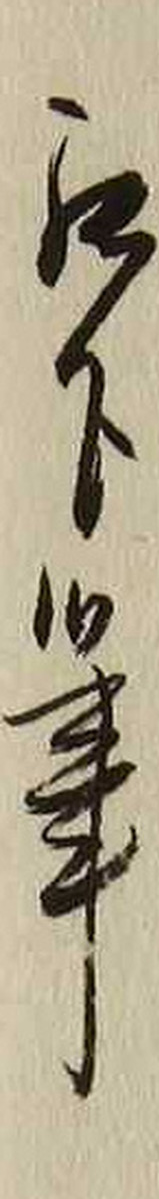罷下候事
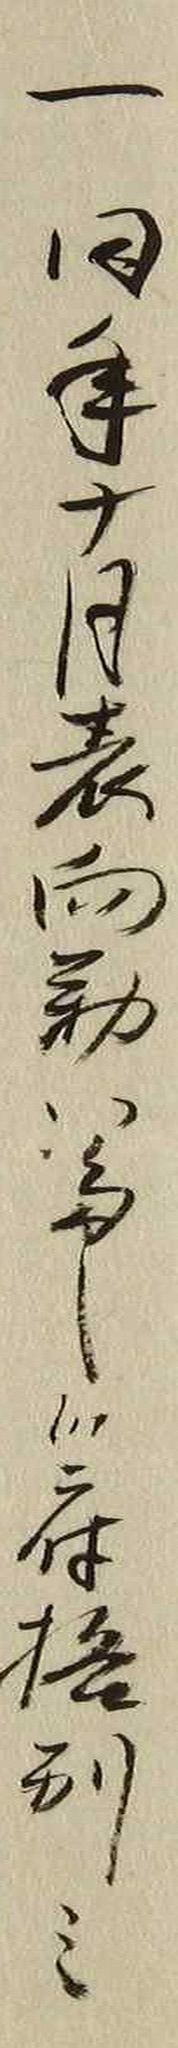一同年十月表向勤いたし候ニ付格別之
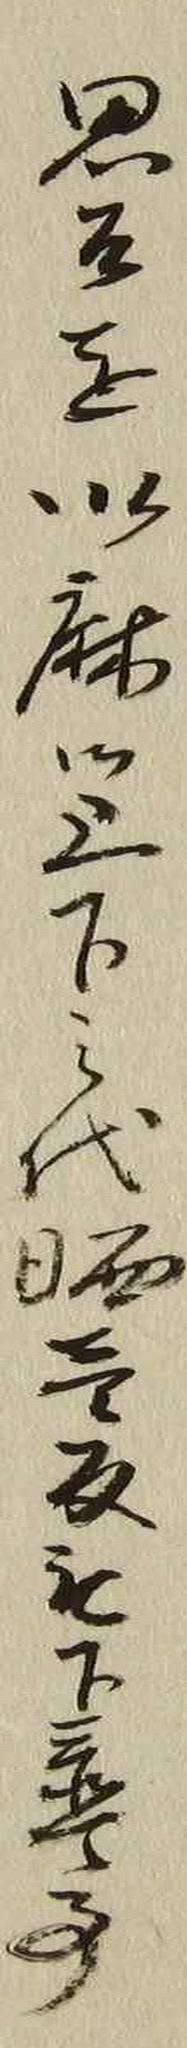思召を以麻御上下之代晒壱反被下置候事
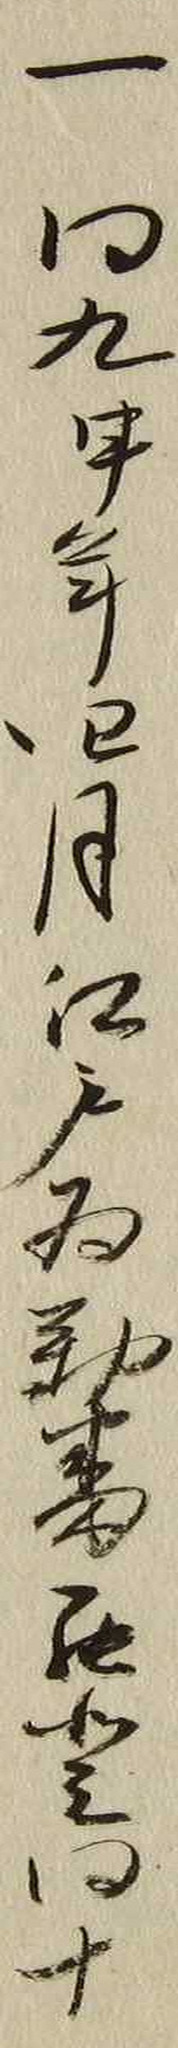一同九申年四月江戸為勤番罷登同十
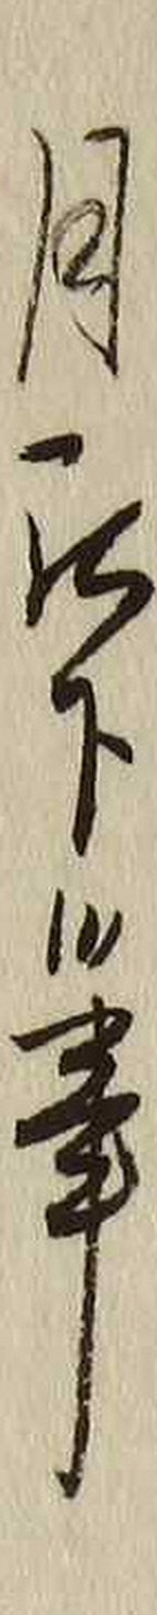月罷下候事
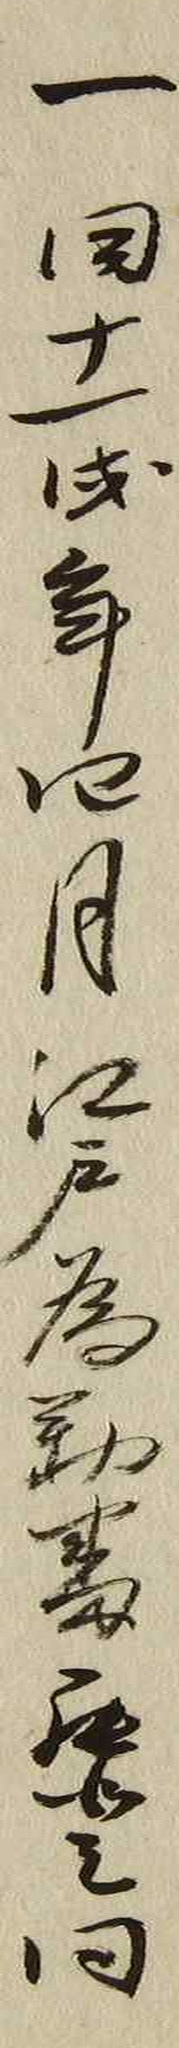一同十一戌年四月江戸為勤番罷登同
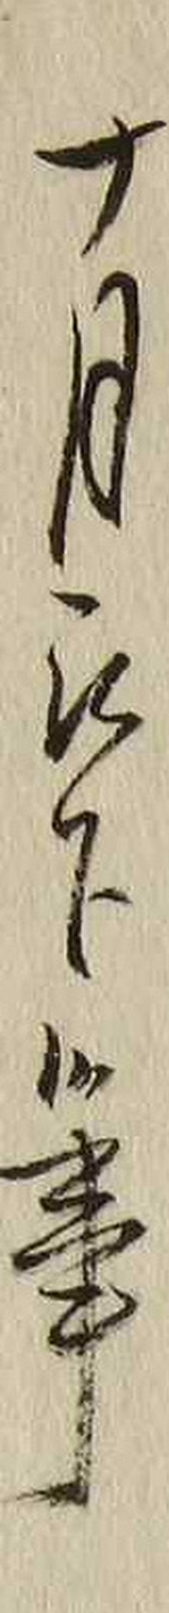十月罷下候事
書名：諸士系譜　巻之345　も之部1
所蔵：会津若松市立会津図書館
